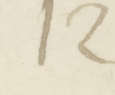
12
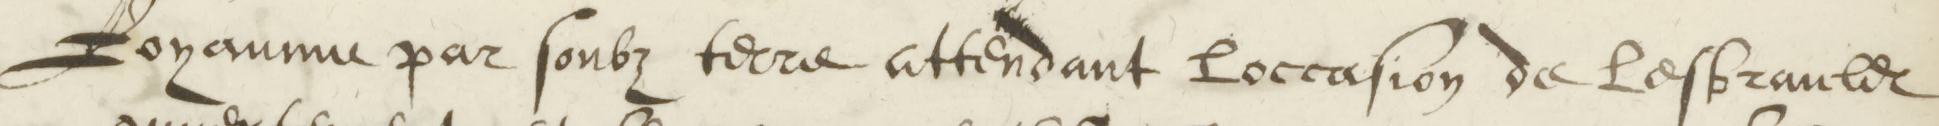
Royaume par soubz terre attendant loccasion de les branler
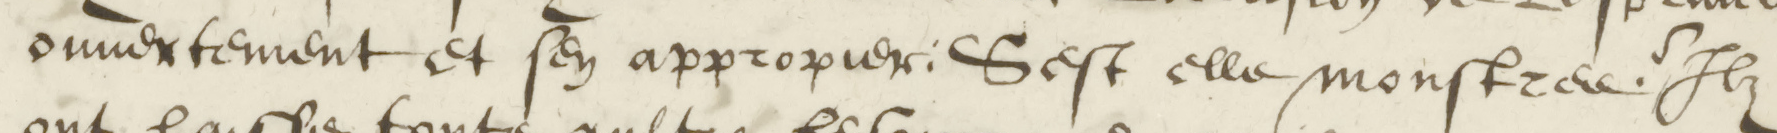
ouvertement et sen appropier: Sest elle monstrees. Ilz
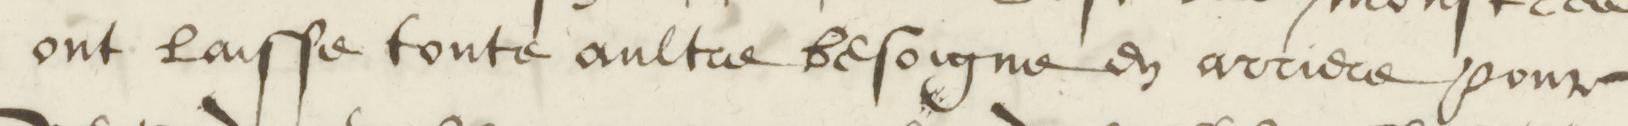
ont laisse toute aultre besoigne en arriere pour„
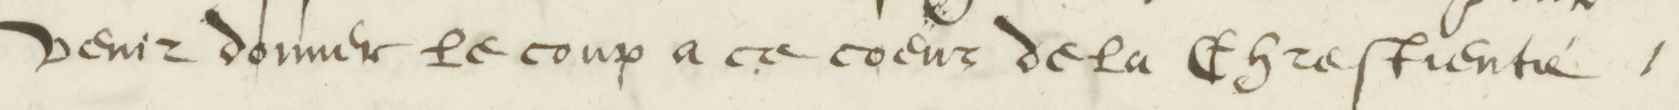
venir donner le coup a ce coeur de la Chrestientié.
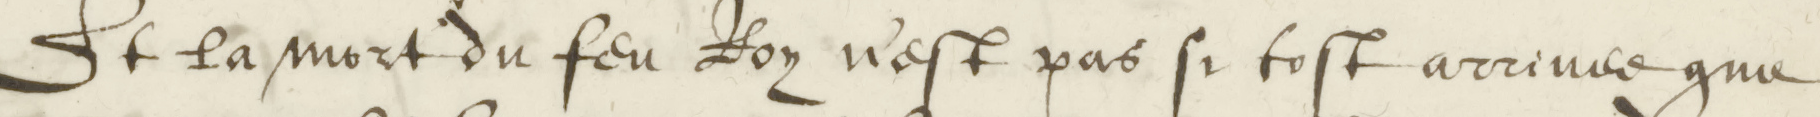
Et la mort du feu Roy n‛est pas si tost arriuee que
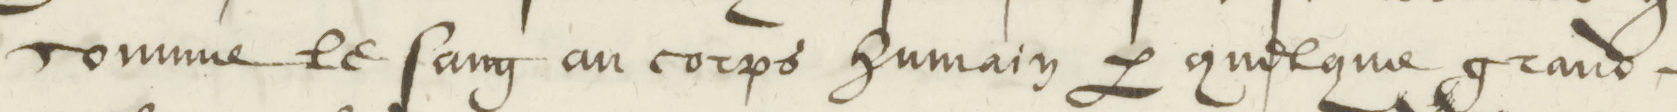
comme le sang au corps humain L quelque grand
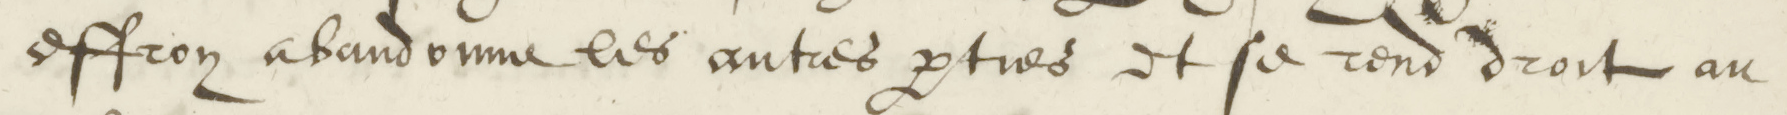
effroy abandonne les autes pties et se rend droit au
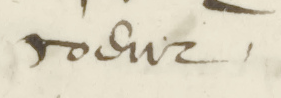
coeur.
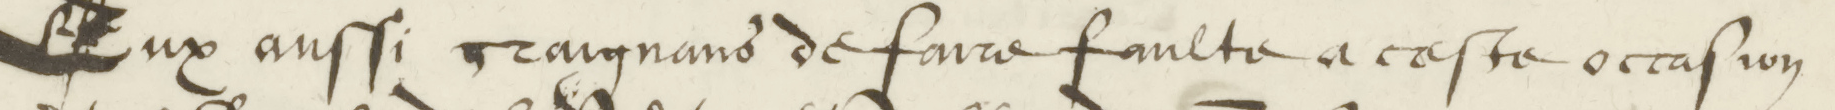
Eux aussi craignans de faire faulte a ceste occasion
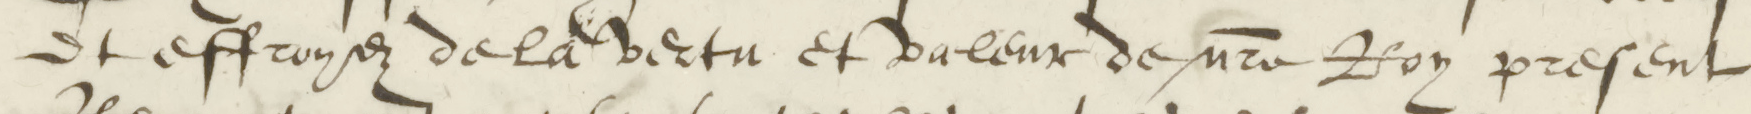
et effroyez de la vertu et valeur de nre Roy present
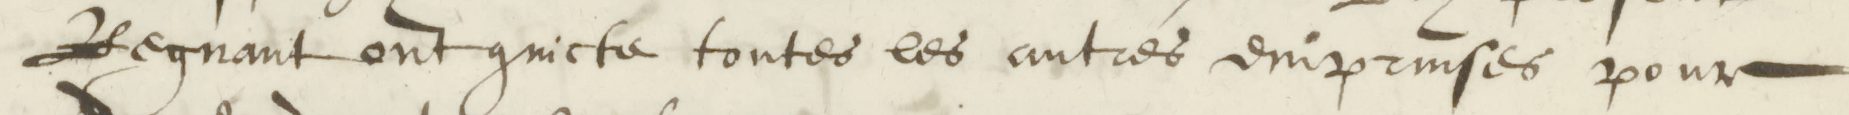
Regnant ont quicte toutes les autres emprinses pour
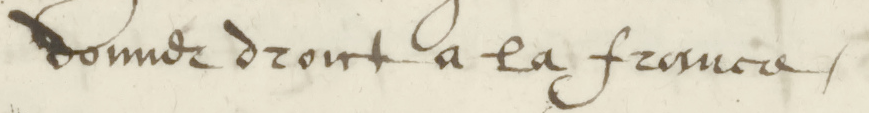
donner droict a la france.
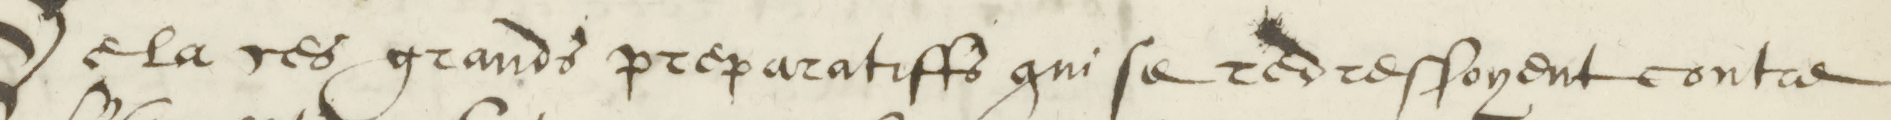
Dela ces grands preparatiffs qui se redressoyent contre
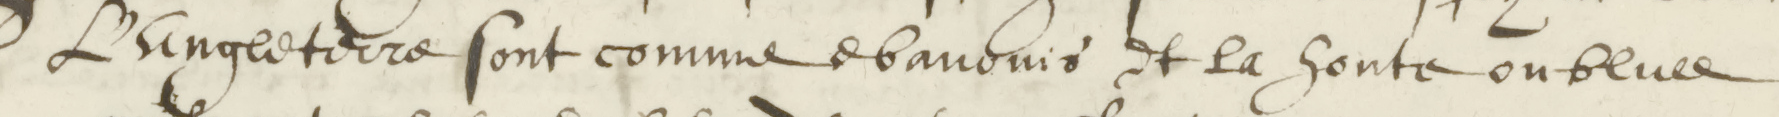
L‛Angleterre sont comme evanouis et la honte oubliee
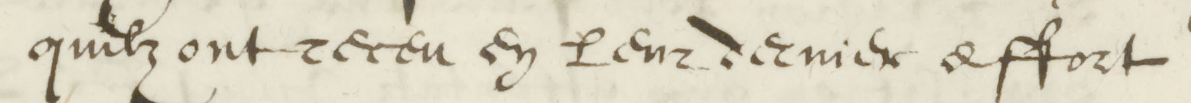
quilz ont receu en Leur dernier effort
